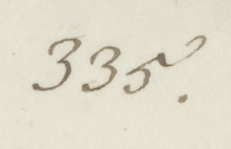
335.
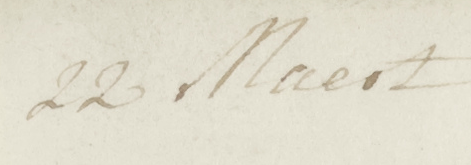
22 Maert
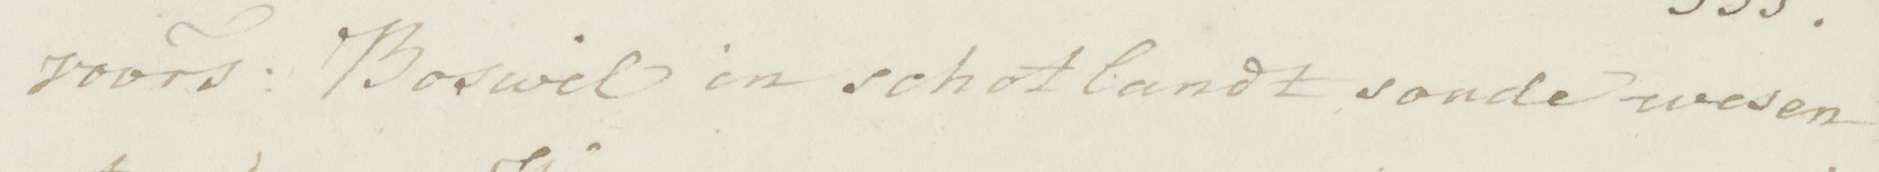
voors: Boswel in schotlandt soude wesen
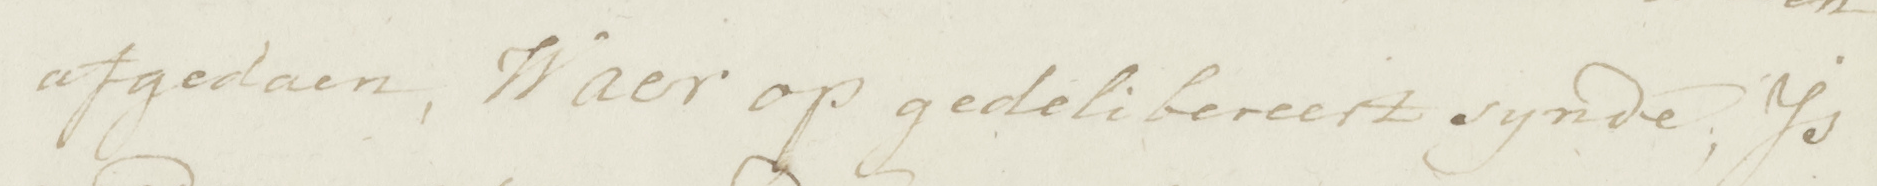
afgedaen, Waer op gedelibereert sijnde, Is
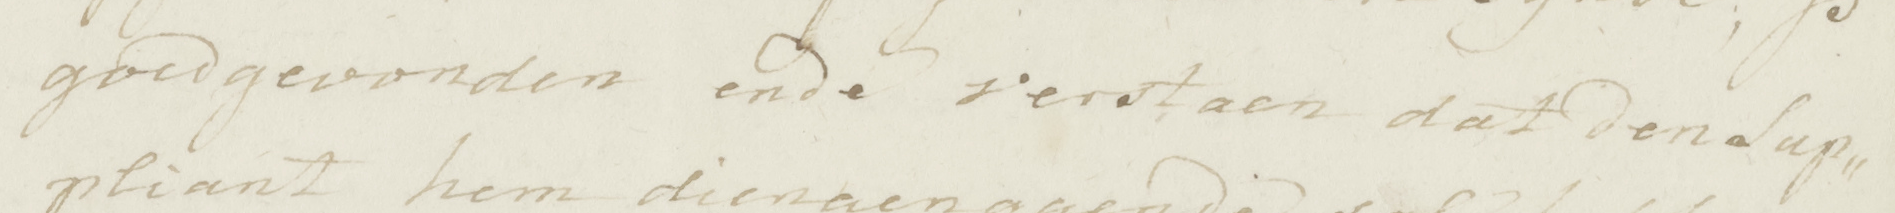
goedgevonden ende verstaen dat den Sup„
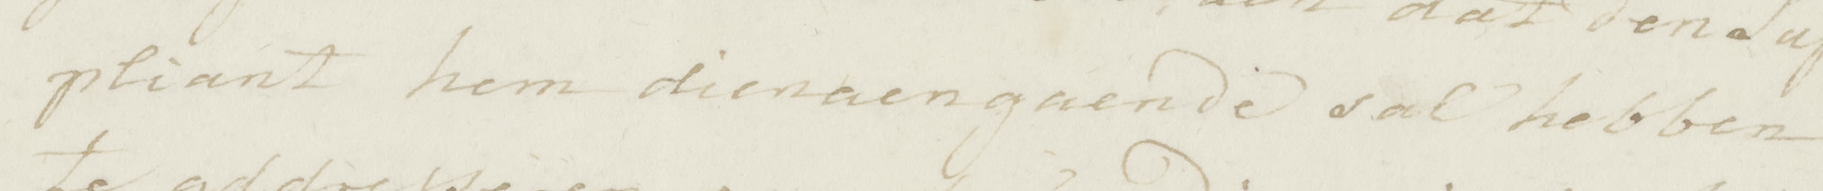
pliant hem dienaengaende sal hebben
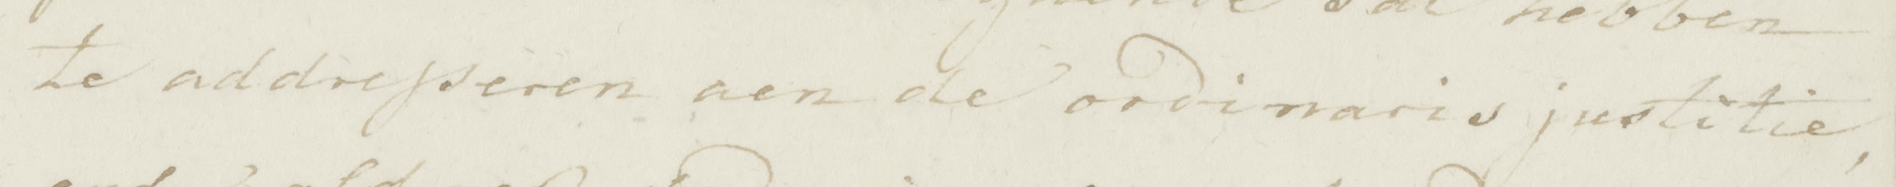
te addresseren aen de ordinaris justitie
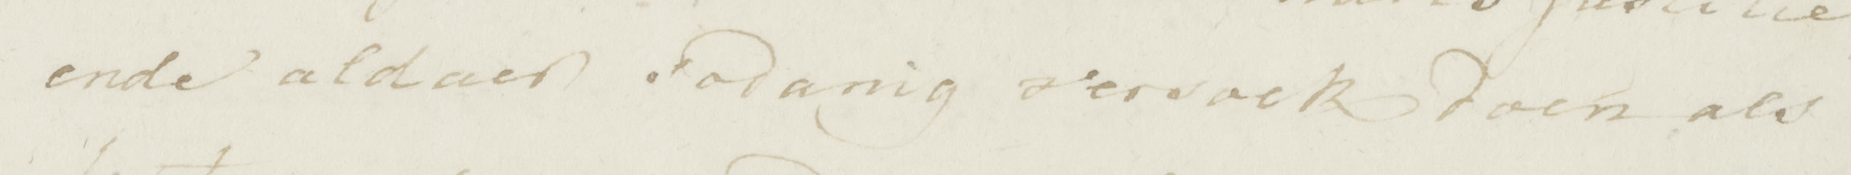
ende aldaer sodanig versoek doen als
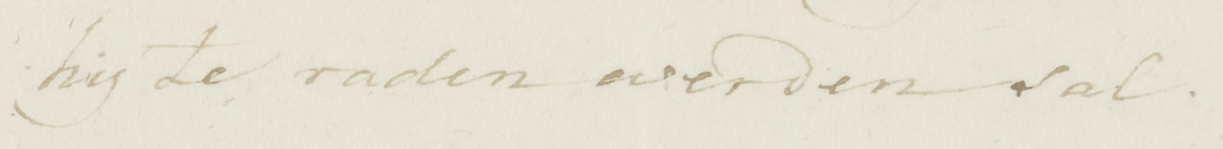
hij te raden werden sal.
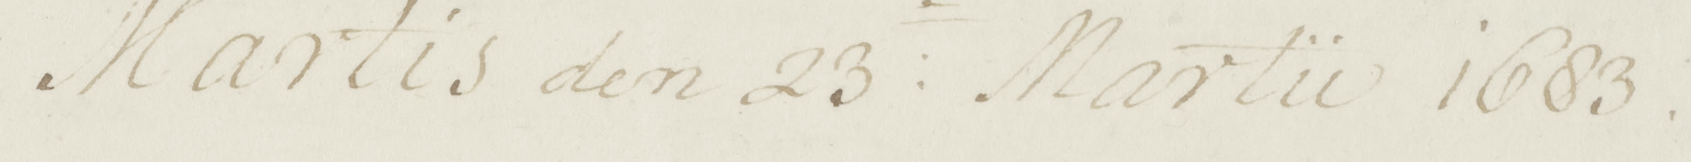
Martis den 23e: Martii 1683.
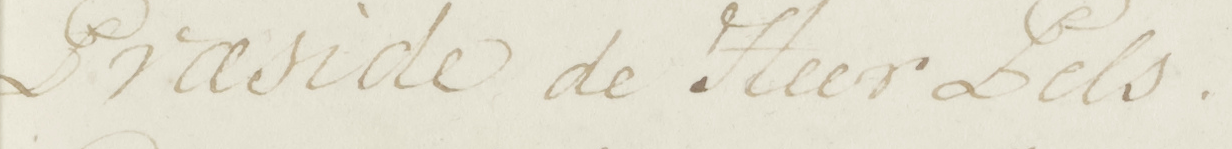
Præside de Heer Pels.
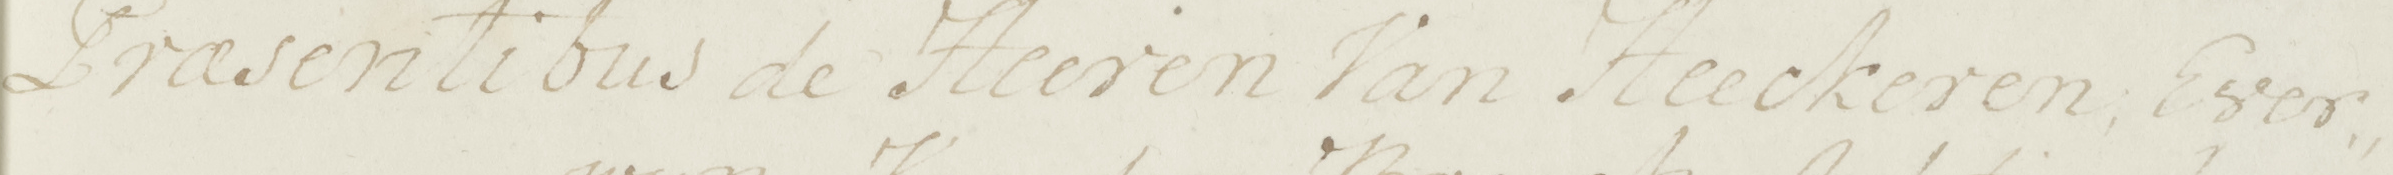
Præsentibus de Heeren van Heeckeren, Ever„
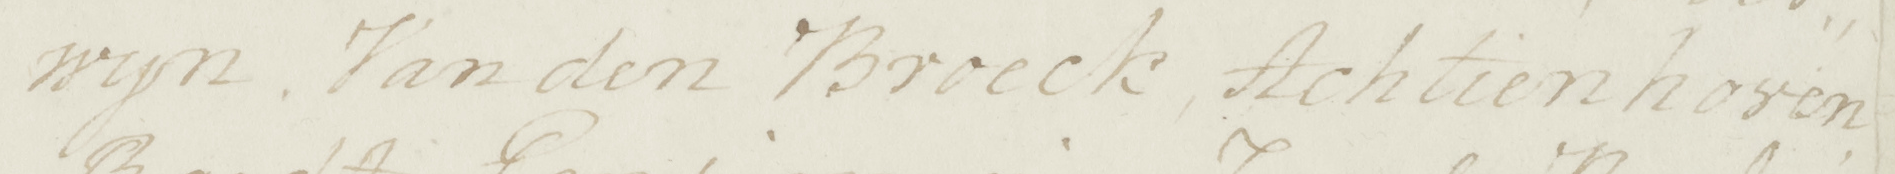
wijn, Van den Broeck, Achtienhoven
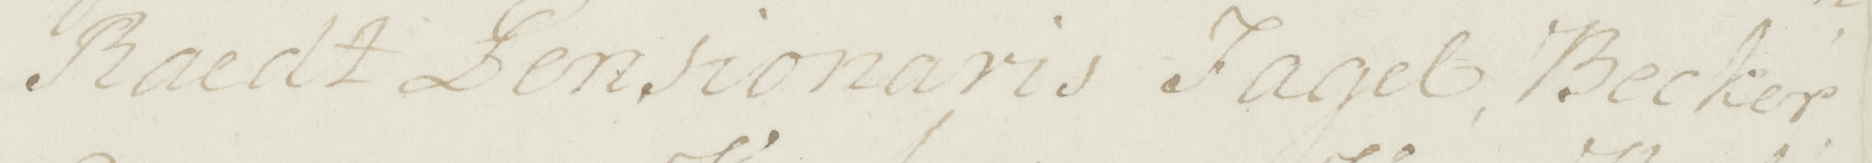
Raedt Pensionaris Fagel, Becker
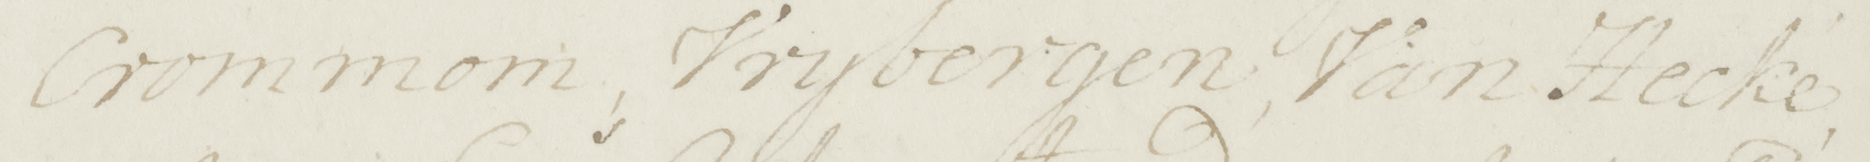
Crommom, Vrijbergen, Van Hecke,
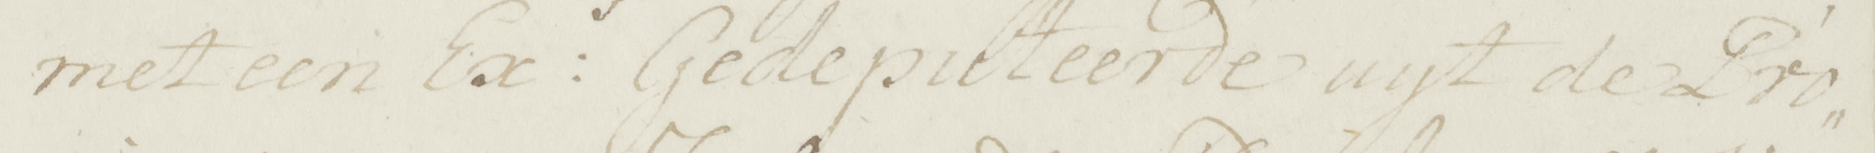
met een Exs: Gedeputeerde uijt de Pro„
